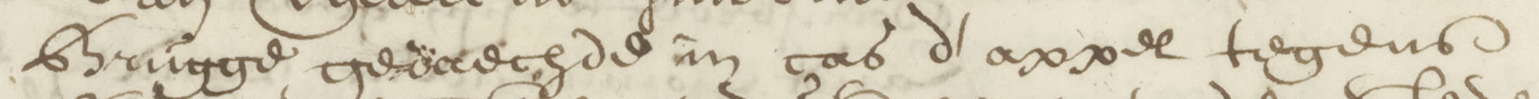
Brugge gedaechde in cas d'appel tegens
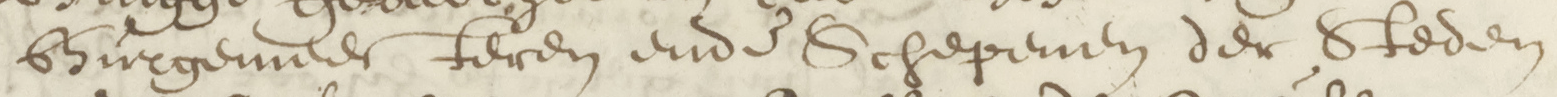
Burgemeesteren ende Schepenen der Steden
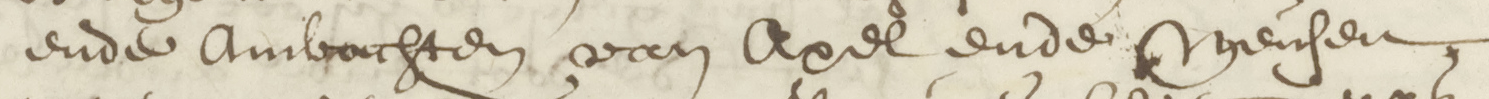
ende Ambachten van Axel ende Neusen
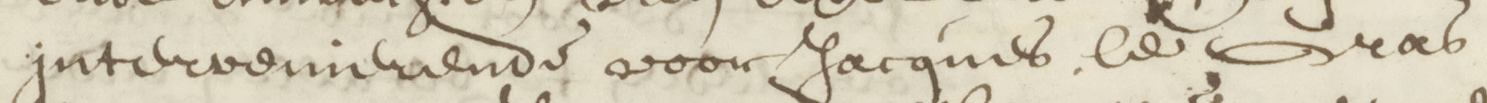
intervenierende voor Jacques le Gras
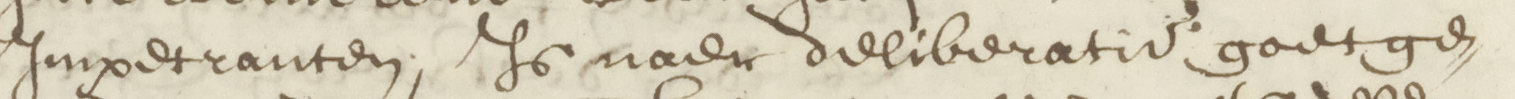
Impetranten; Is naer deliberatie goetge„
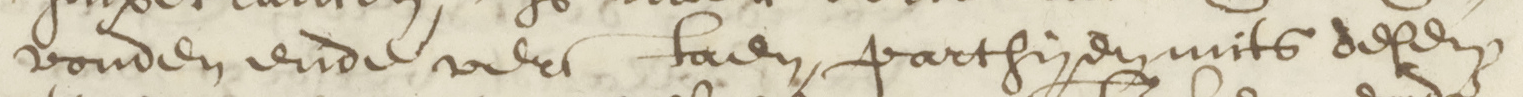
vonden ende verstaen, parthijen mits desen
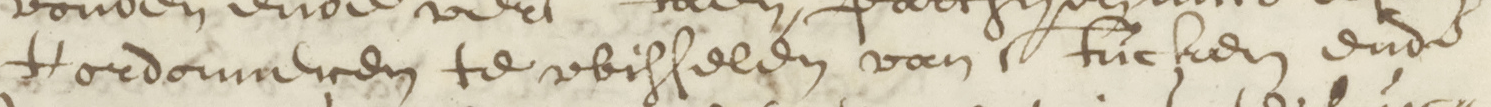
t‛ordonneren te wisselen van stucken ende
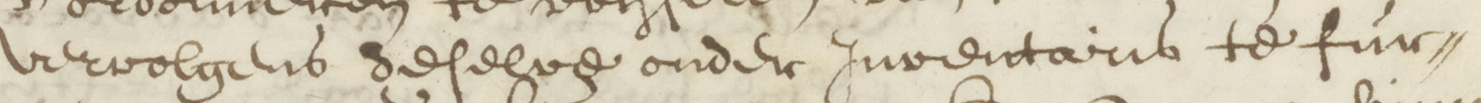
vervolgens deselve onder Inventaris te fur„
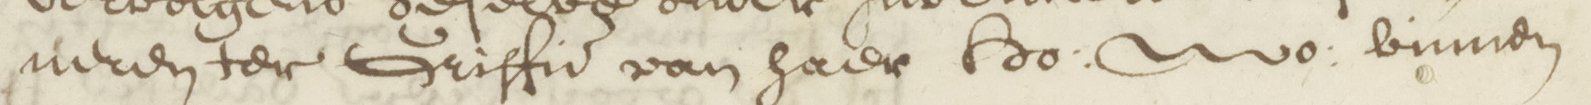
neren ter Griffie van haer Ho:Mo: binnen
